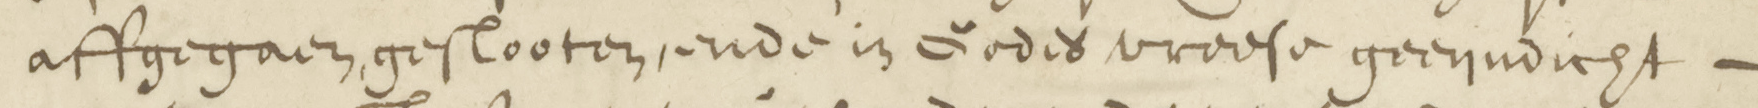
affgegaen, geslooten, ende in Godes vreese geeyndicht
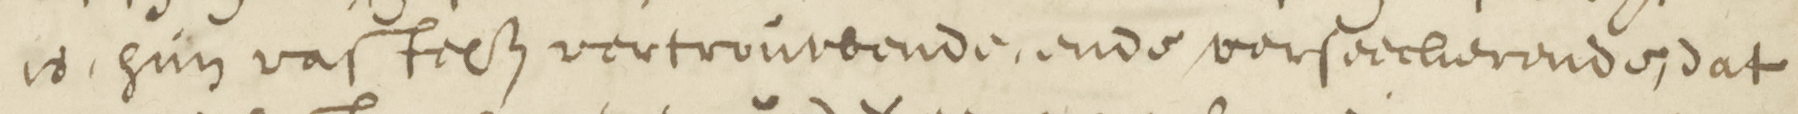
is, hun vastel vertrouwende, ende verseeckerende, dat
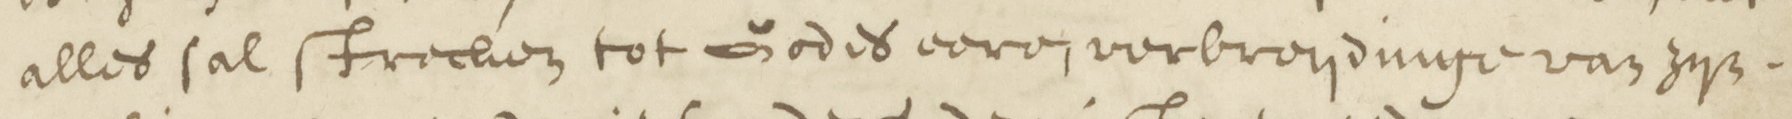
alles sal strecken tot Godes eeren, verbreydinge van zyn
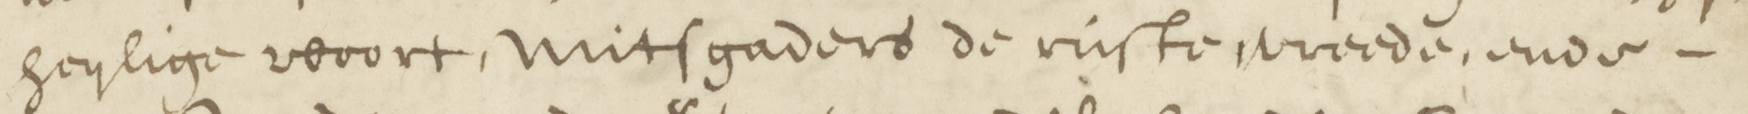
heylige woort, mitsgaders de ruste, vreede, ende
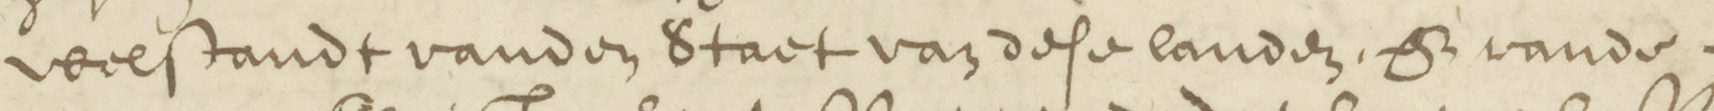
welstandt vanden Staet van dese landen, & vande
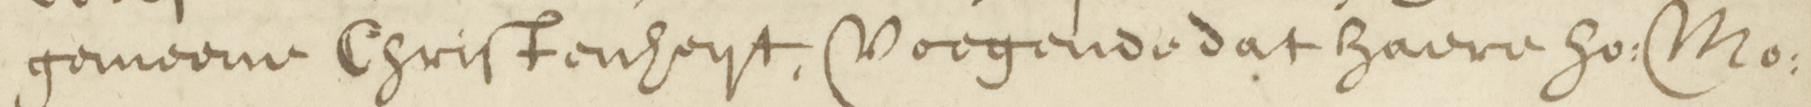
gemeene Christenheyt. Voegende dat haere ho:Mo:
